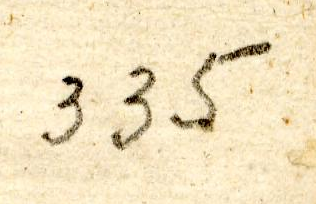335
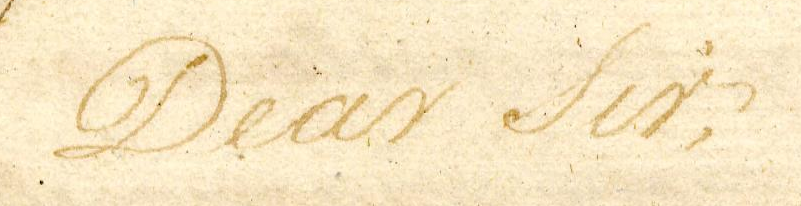Dear Sir
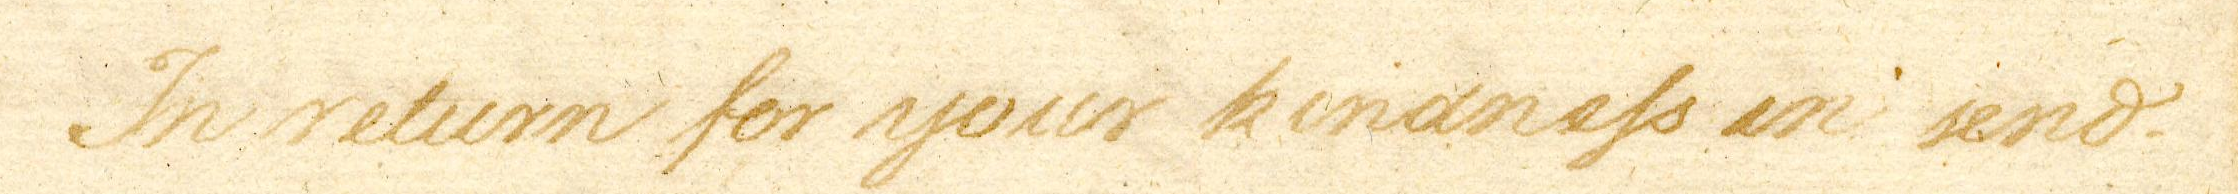In return for your kindness in send-
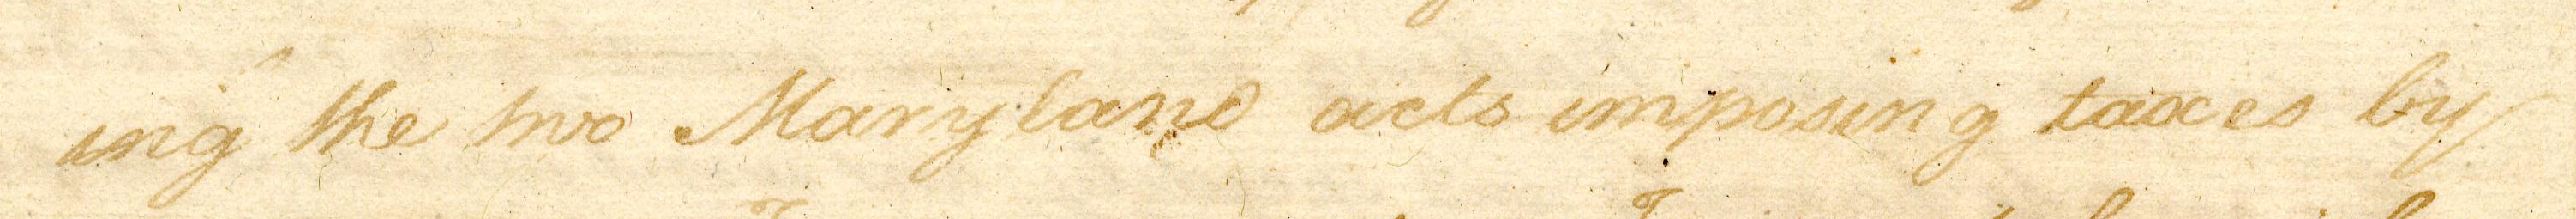ing the two Maryland acts imposing taxes by
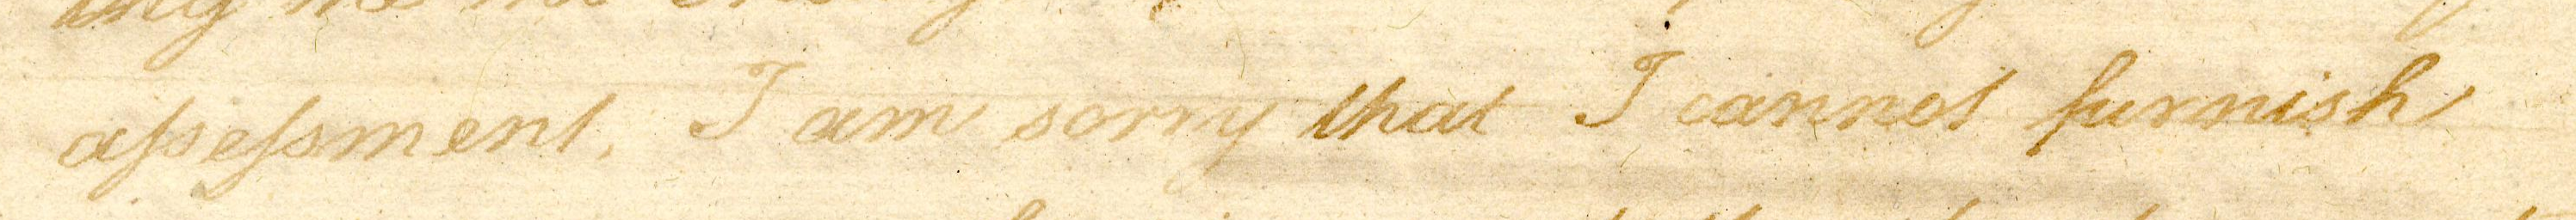assessement, I am sorry that I cannot furnish
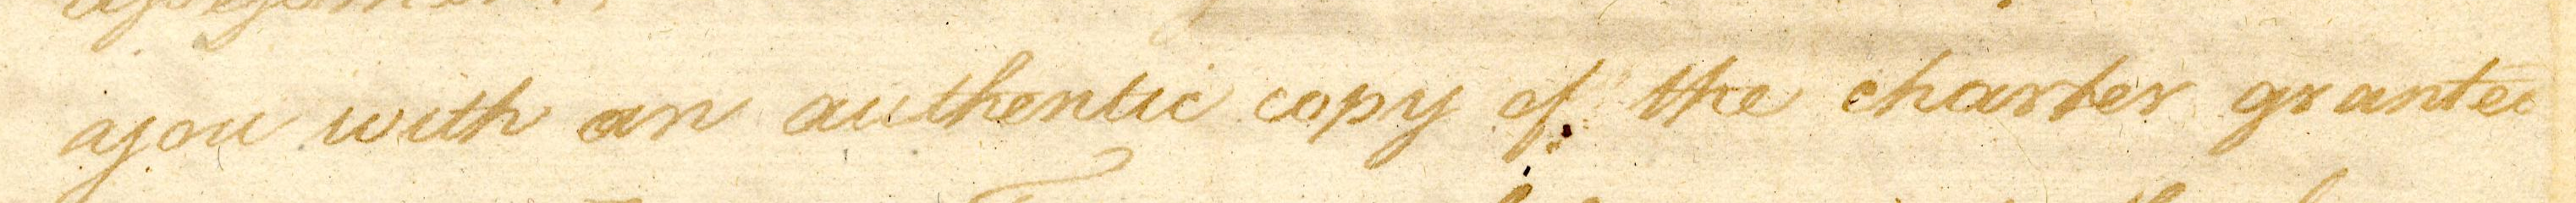you with an authenticated copy of, the charter granted
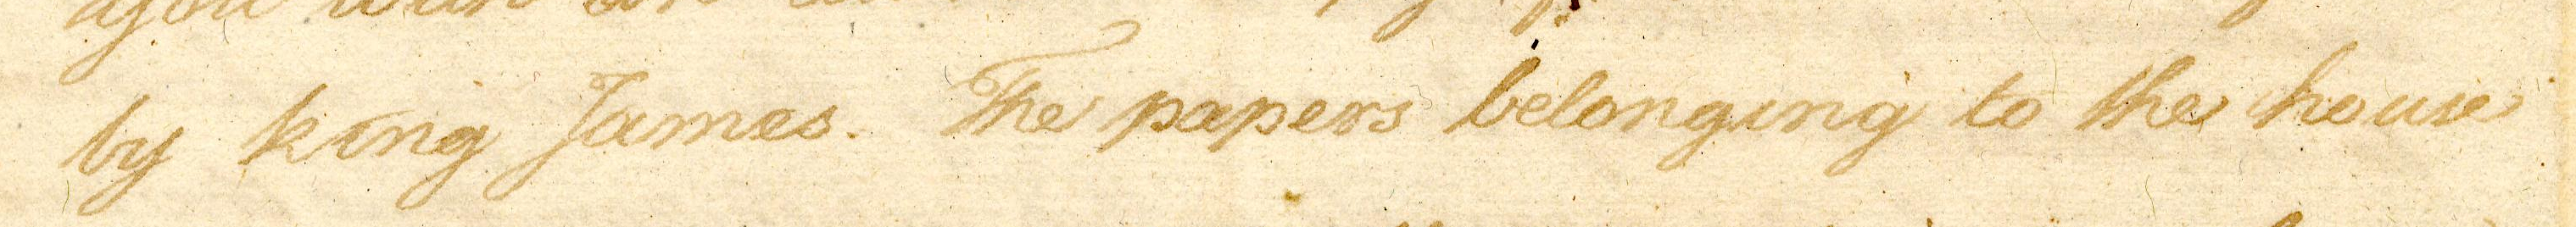by King James. The papers belonging to the house
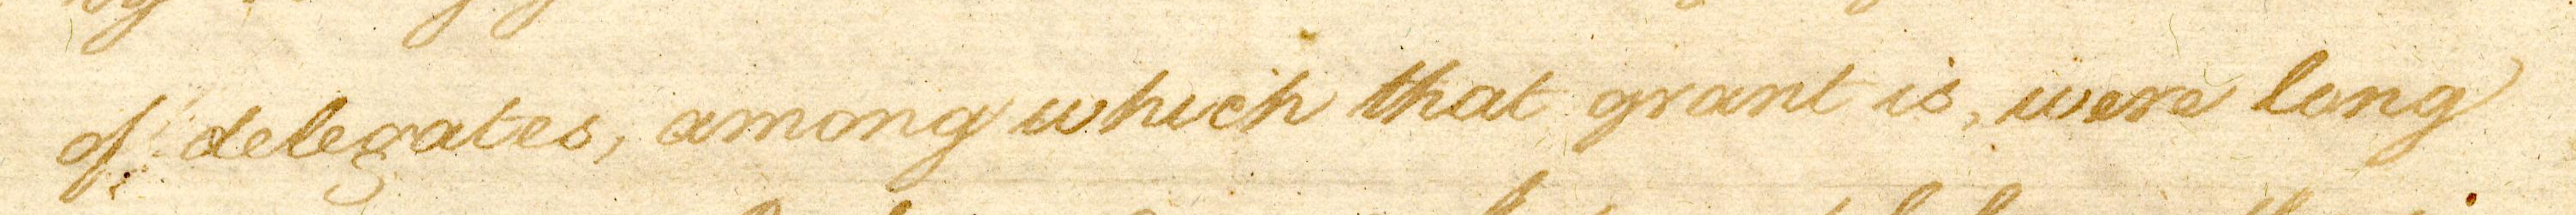of delegates, among which that grant is, were long
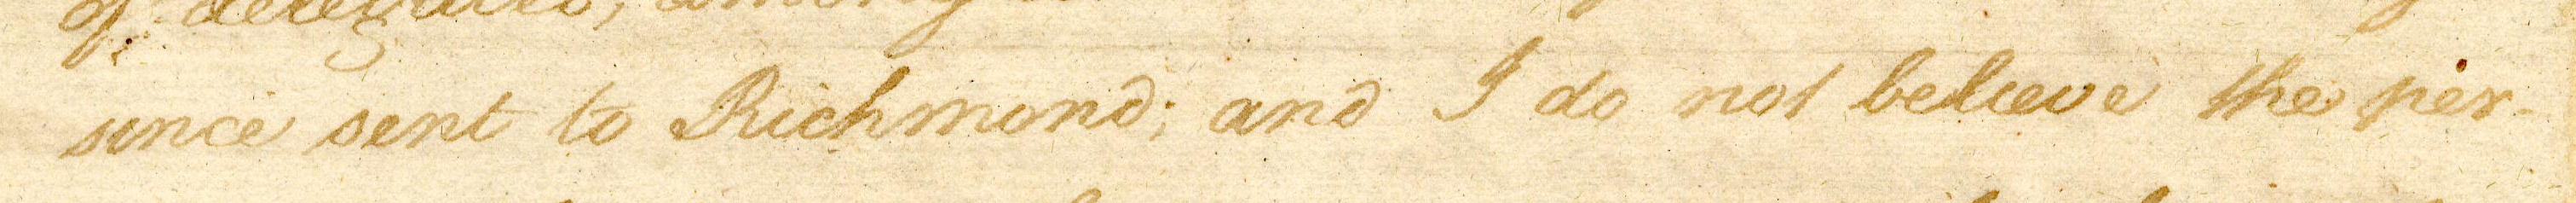since sent to Richmond; and I do not believe the per-
